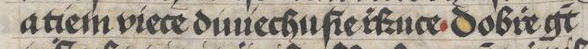a tiem víece diuíechu ſie ṙkuce.Dobṙe ḡt
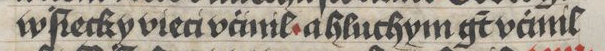wẛiecky vieci vċinil.a hluchym ḡt vċinil
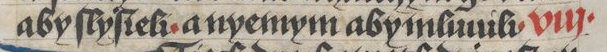aby ſlyẛieli.a nyemym aby mluuili.viij.
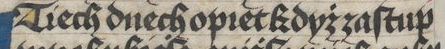Tíech dnech opiet kdyż zaſtup
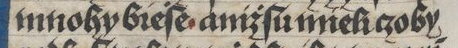mnohy bíeẛe.aniżſu mieli czoby
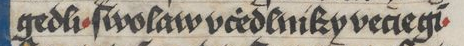gedli.ſwolaw vċedlníky vecie gī.
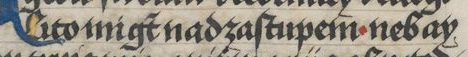Lito mi ḡt nad zaſtupem.neb ay
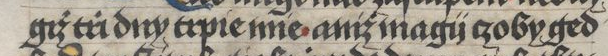giż tṙi dny trpie mie.aniž magij czoby ged¬
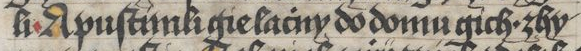li.A puſimli gie laċny do domu gich.zhy¬
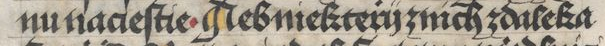nu nacieſtie. Neb niekteṙij zních zdaleka
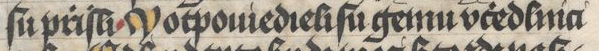ſu pṙiẛli.Y otpouiedieli ſu gemu vċedlníci
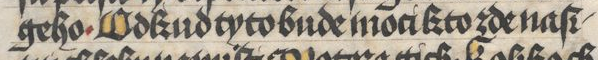geho.Odkud tyto bude moci kto zde naſi¬
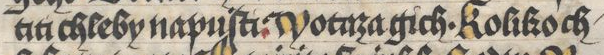titi chleby napuẛti?Yotaza gích.Koliko ch¬
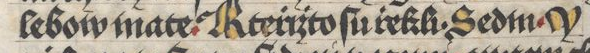lebow mate?Kteṙiżto ſu ṙekli.Sedm.Y
